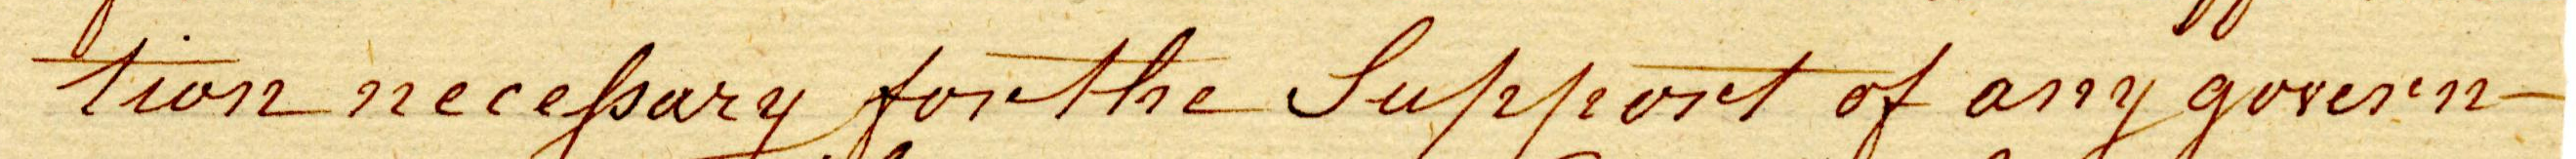tion necessary for the support of any govern-
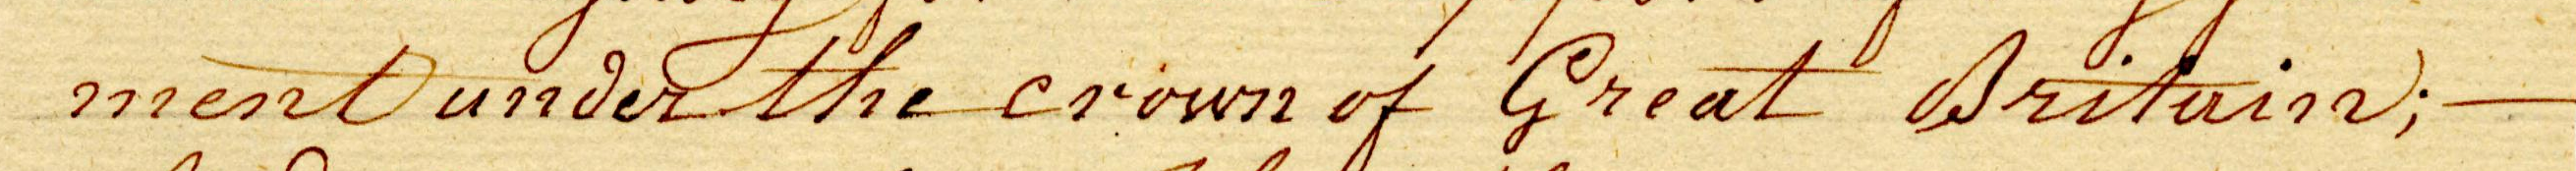ment under the crown of Great Britain;-
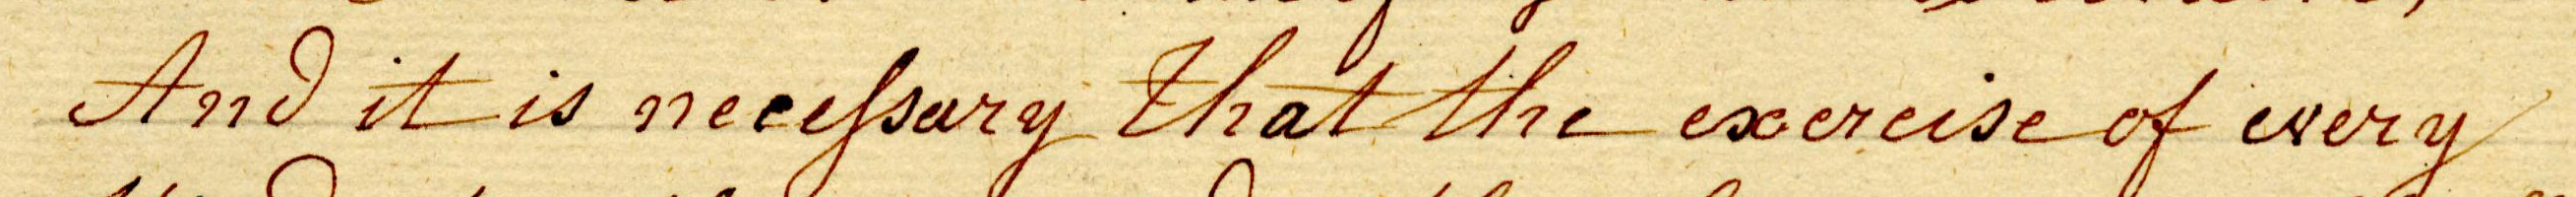And it is necessary that the exercise of every
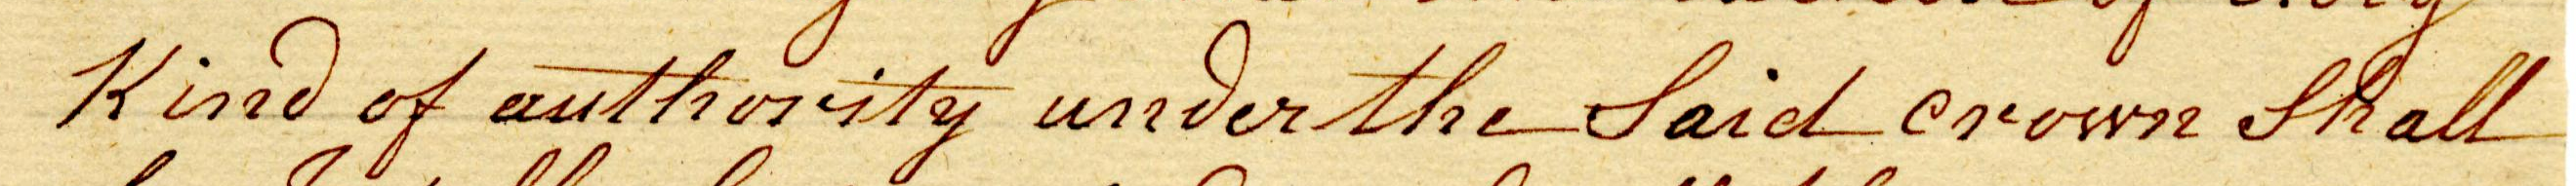Kind of authority under the said crown shall
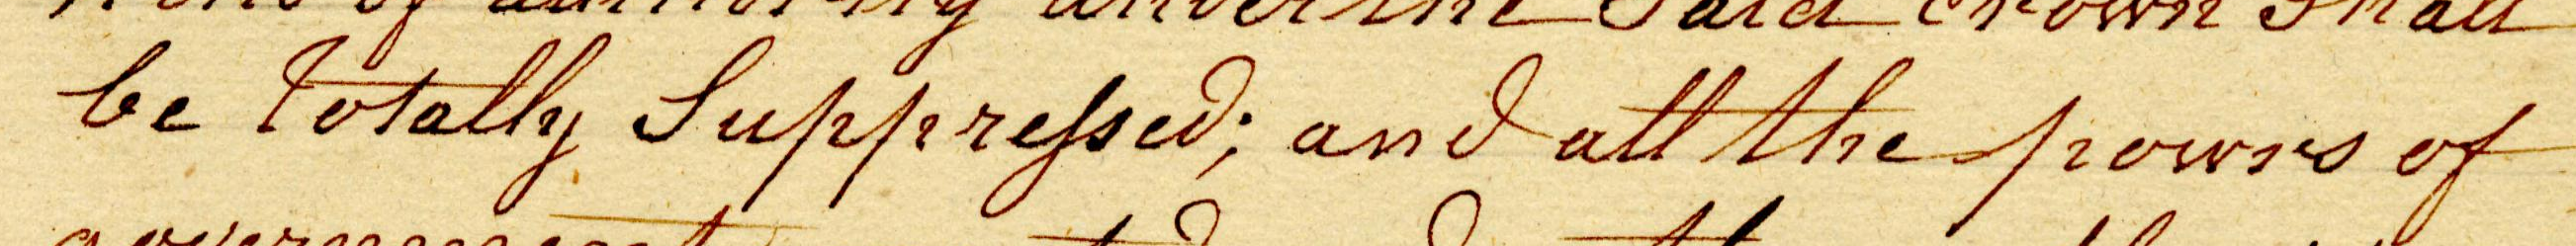be Totally suppressed; and all the powrs of
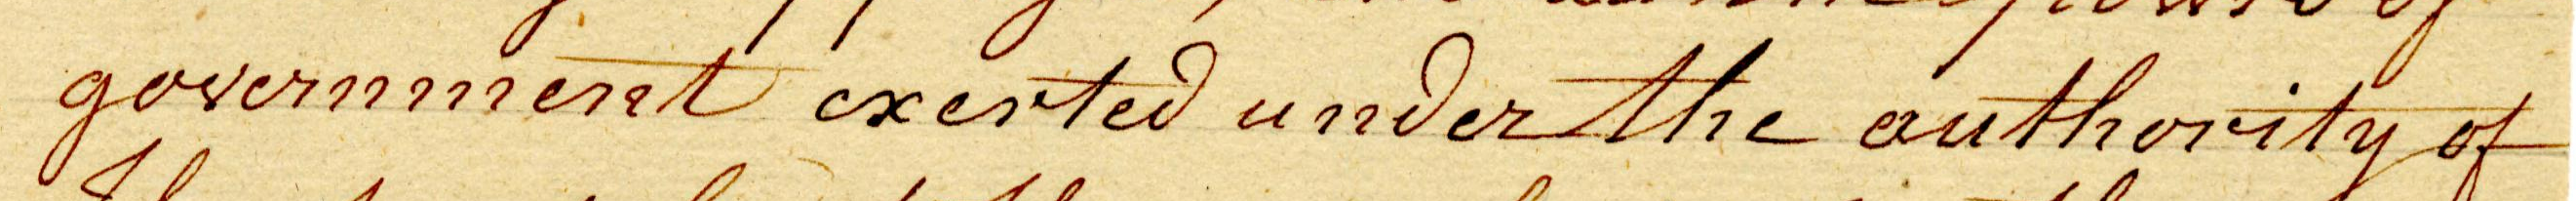government exerted under the authority of
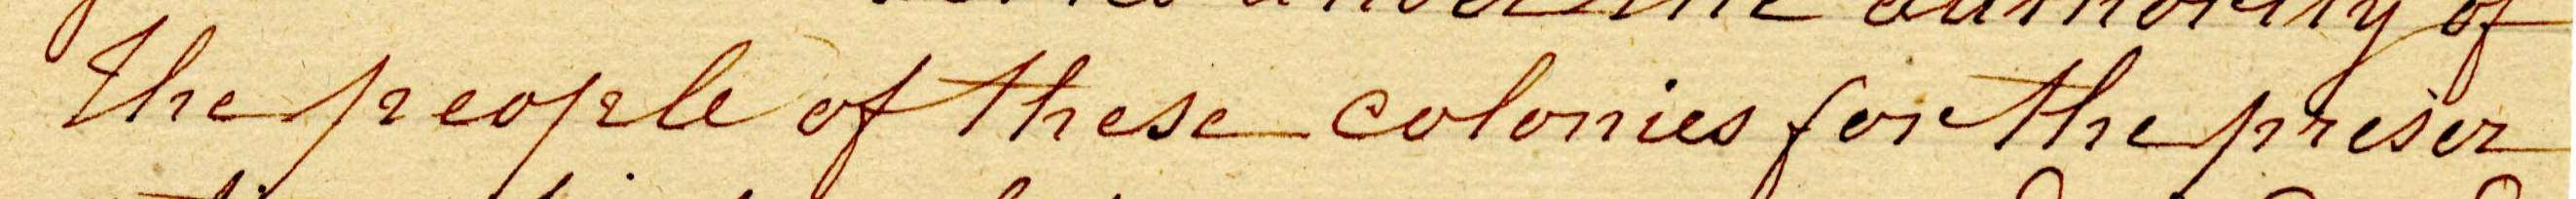The people of these colonies for the preser
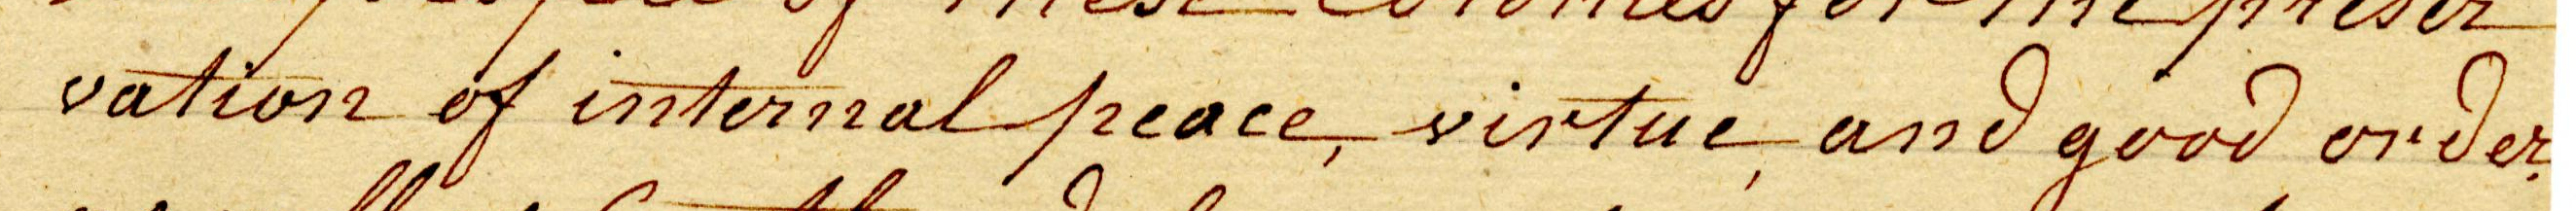vation of internal peace, virtue, and good order,
